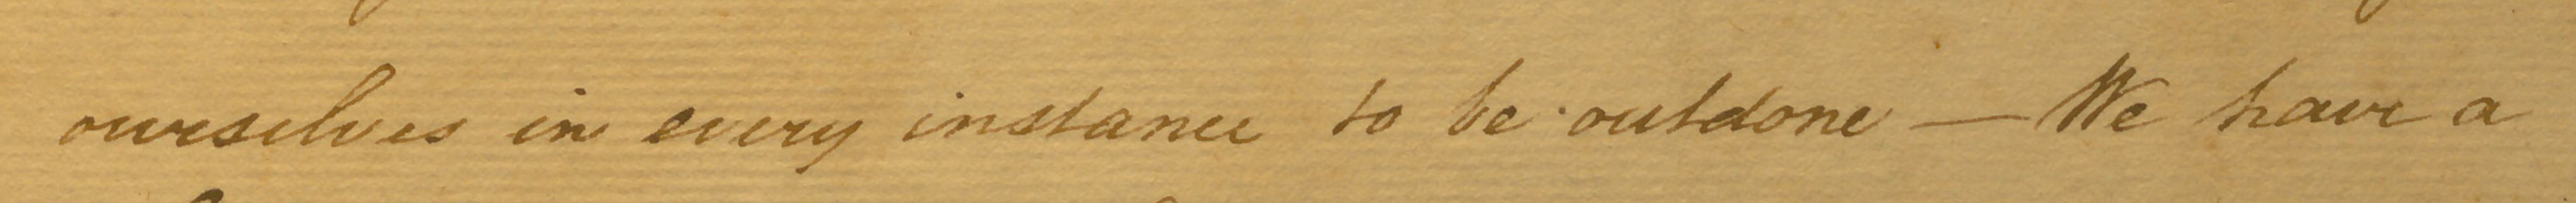ourselves in every instance to be outdone- We have a
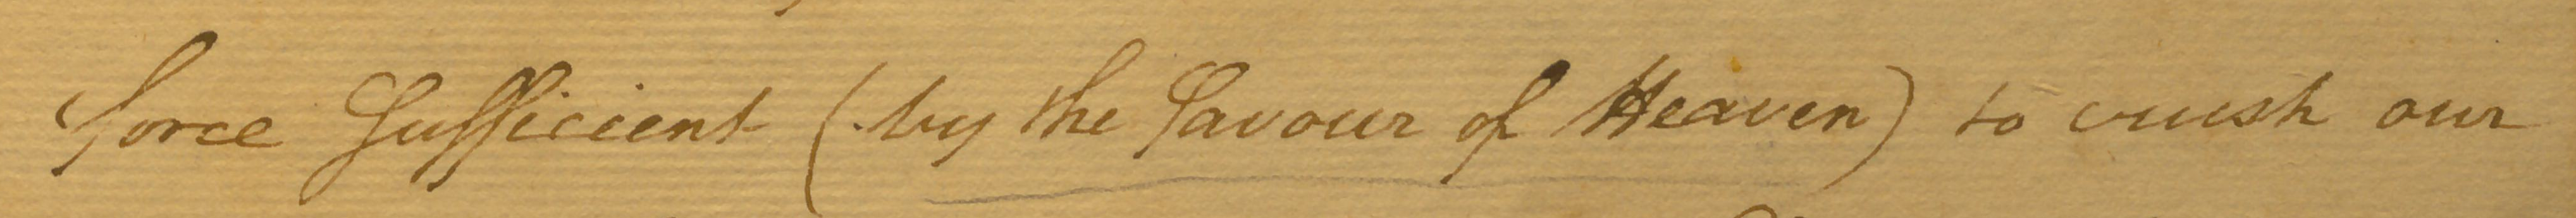force Sufficient (by the favour of Heaven) to crush our
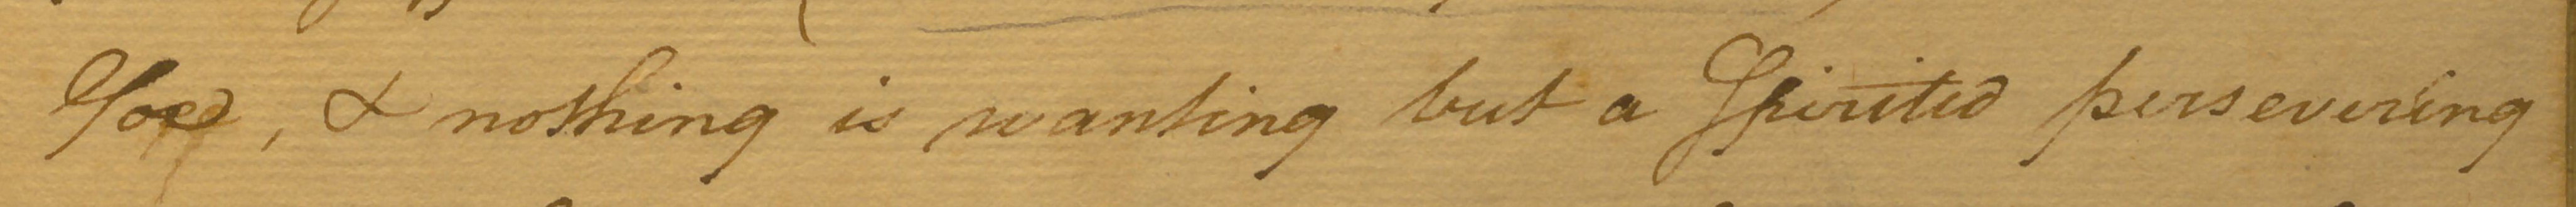foe, & nothing is wanting but a Spirited persevering
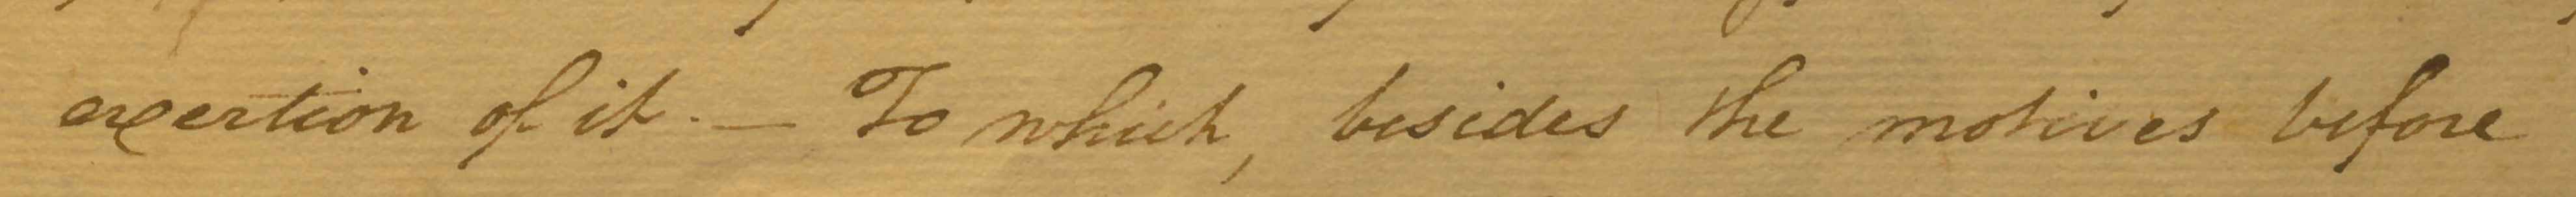exertion of it.- To which besides the motives before
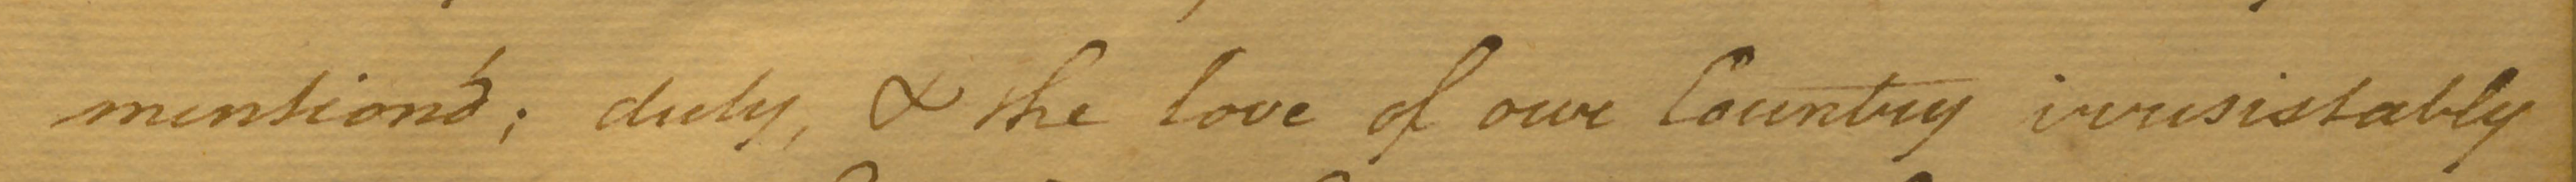mention'd; duty & the love of our Country irresistably
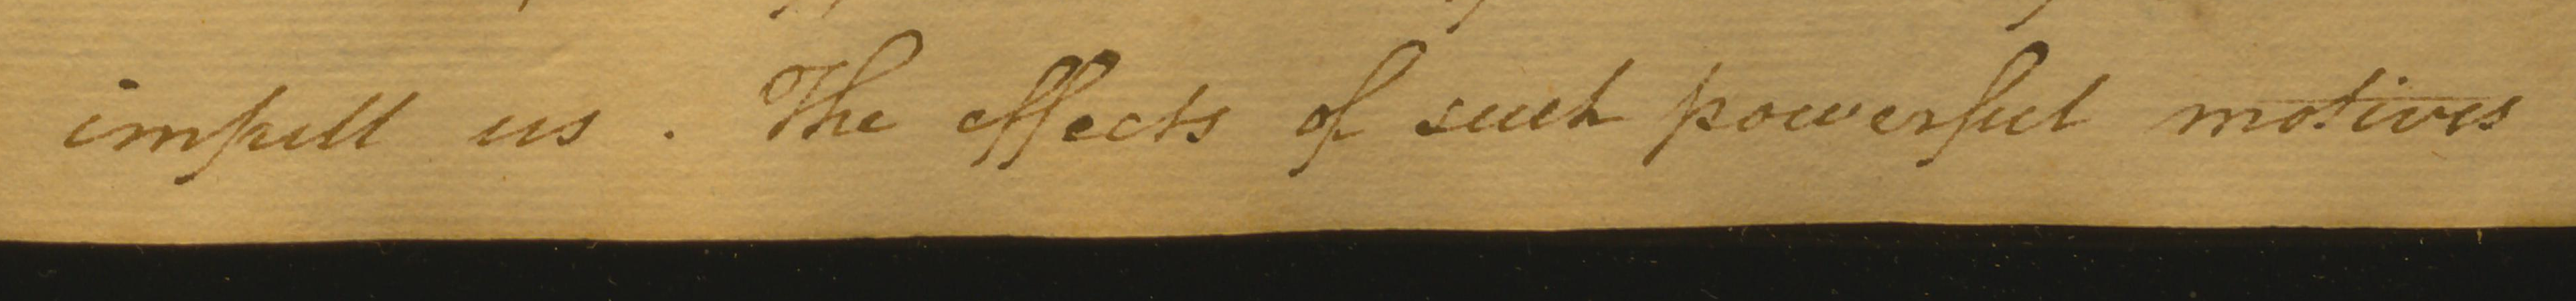impell us. The effects of such powerful motives
